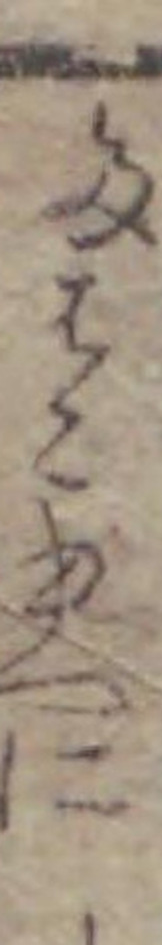たはこゆへに
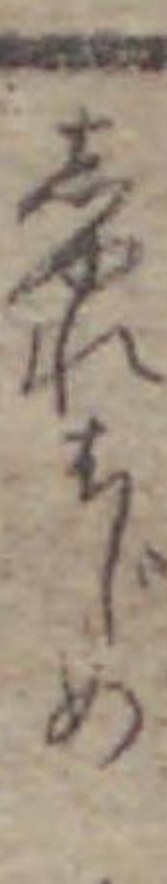しやれはじめ
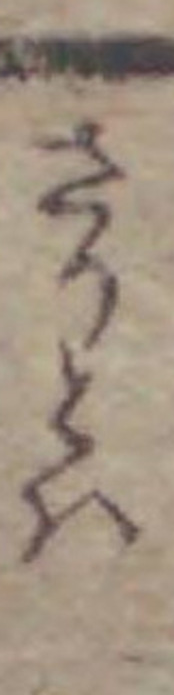さりとは
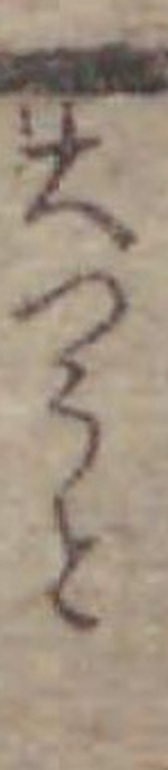大つうと
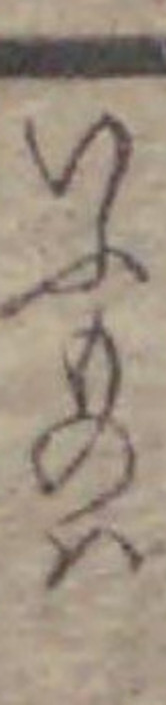いふものは
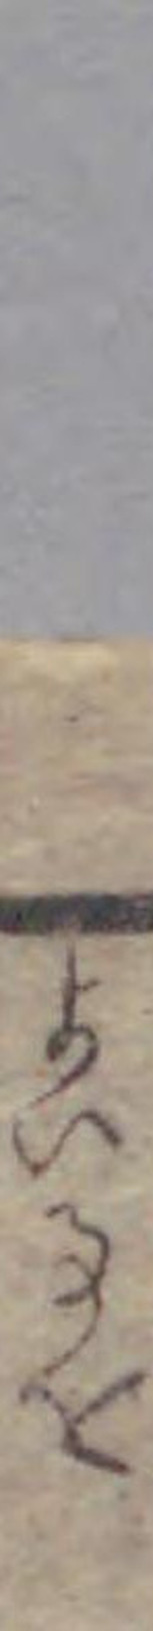よい事を
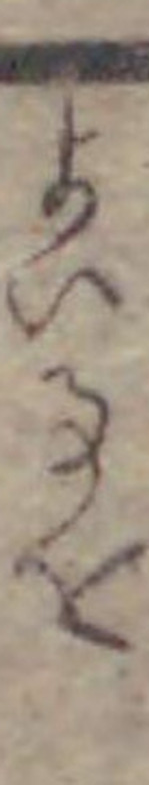よい事を
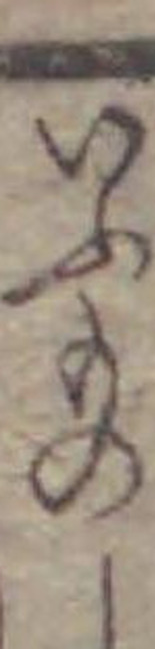いふもの
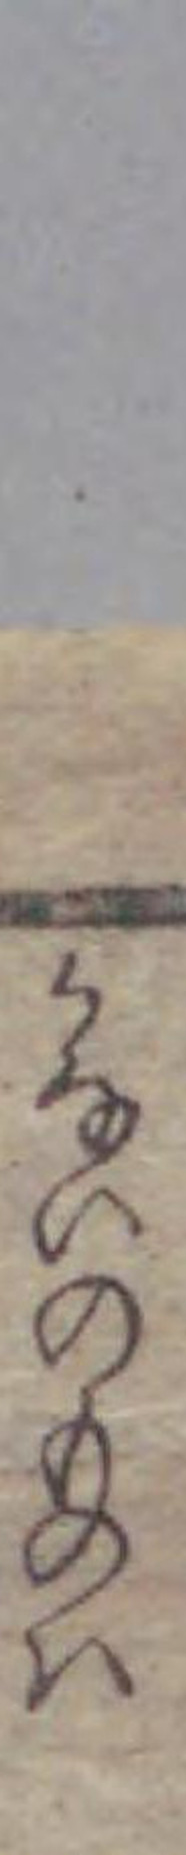かないのものは
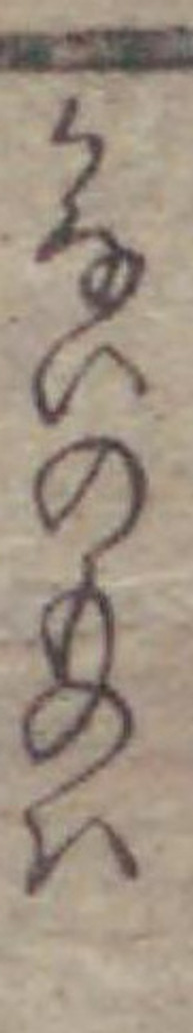かないのものは
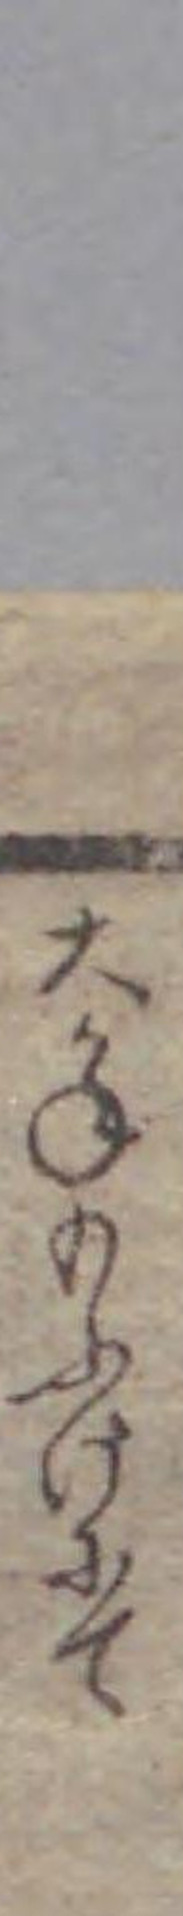大かねのふけにて
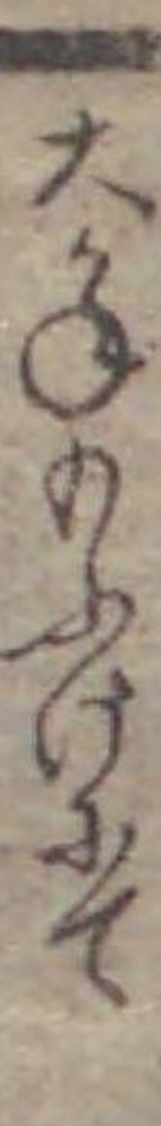大かねのふけにて
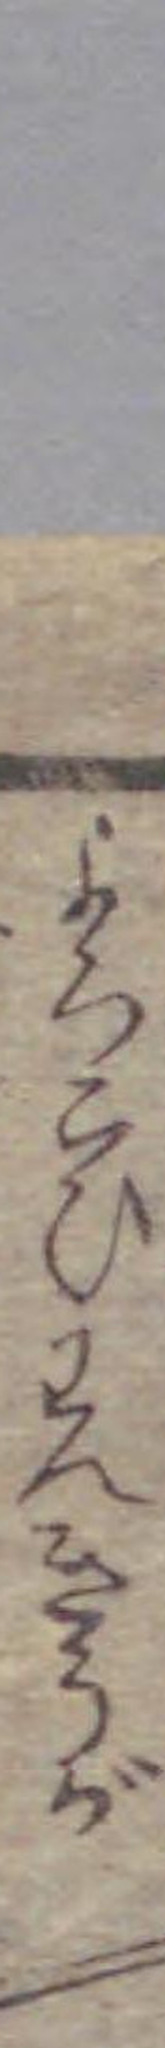よろこひわんきうが
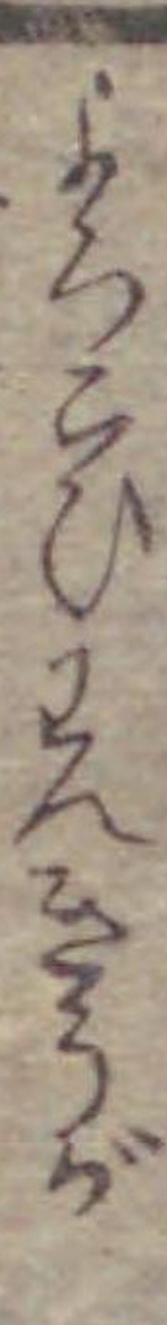よろこひわんきうが
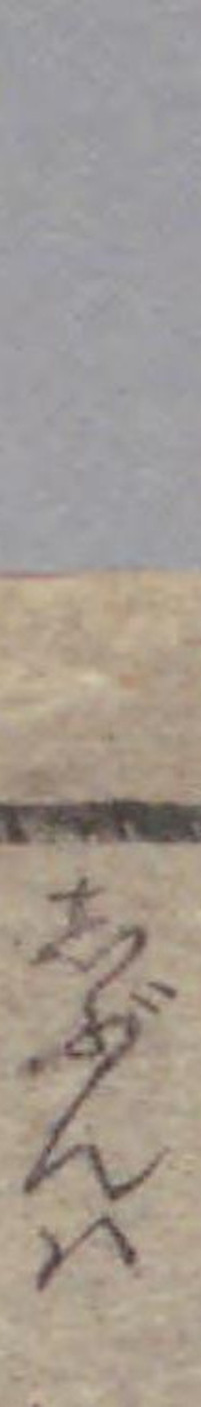しぶんは
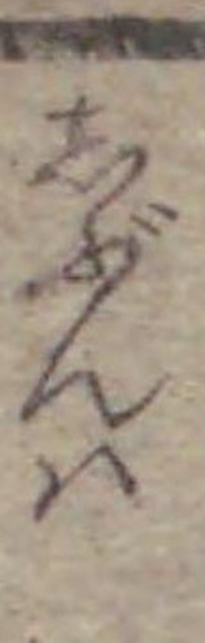しぶんは
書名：談芭菰誉詞 : 3巻
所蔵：国立国会図書館 National Diet Library, JAPAN
